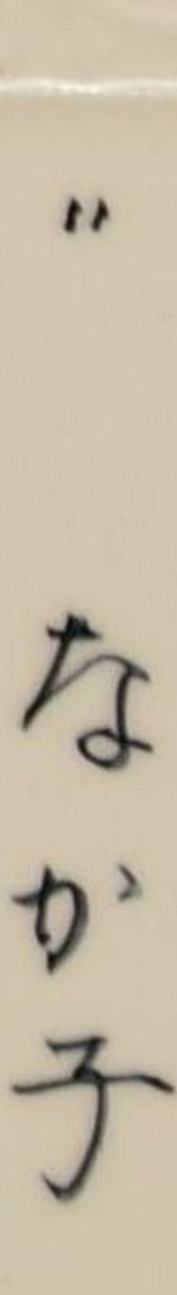なか子
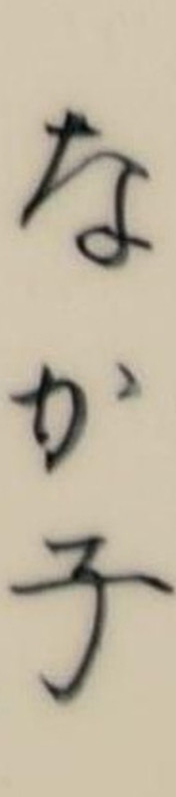なか子
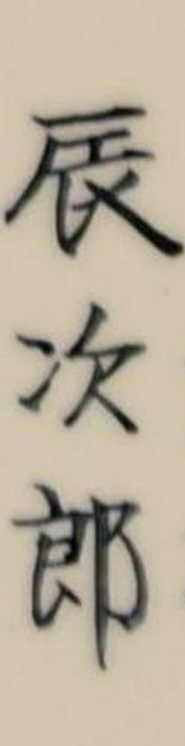辰次郎
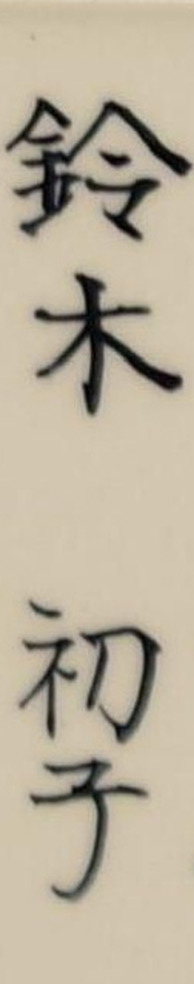鈴木初子
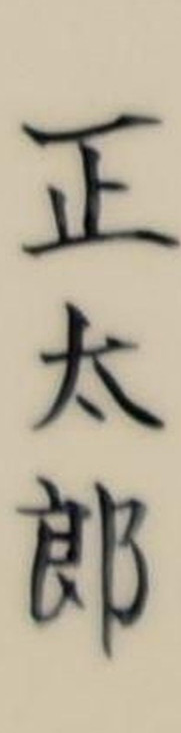正太郎
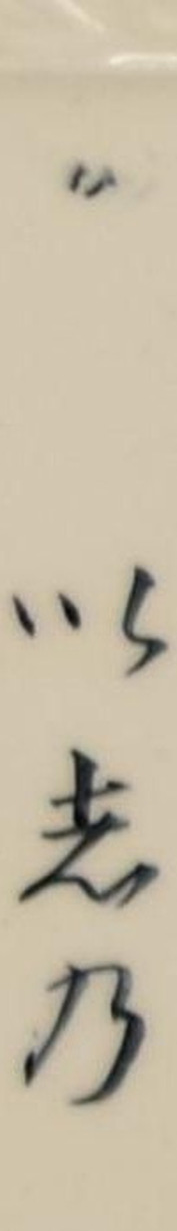いしの
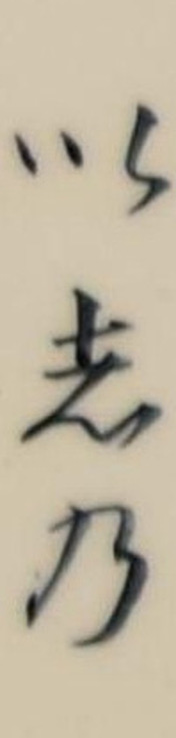いしの
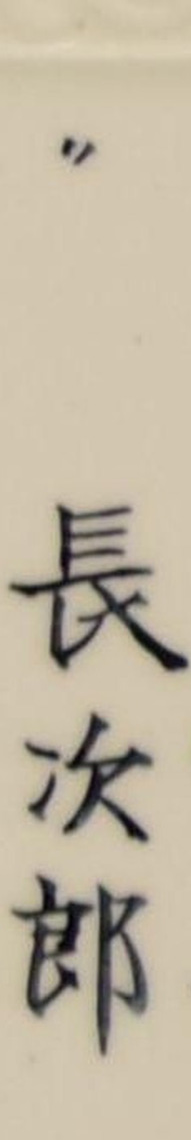長次郎
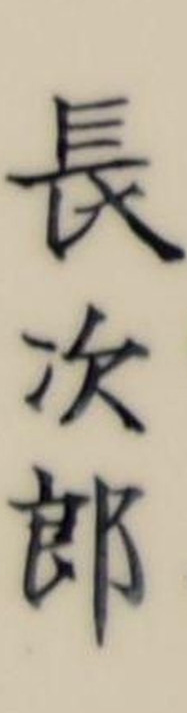長次郎
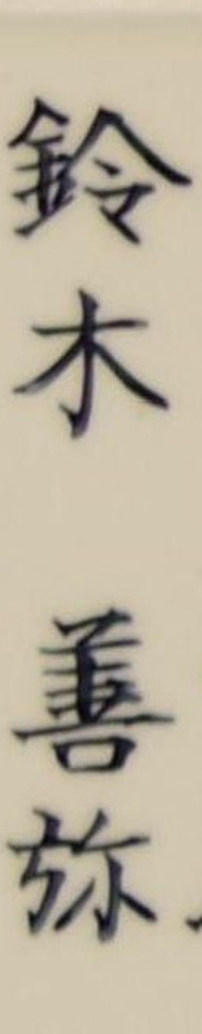鈴木善弥
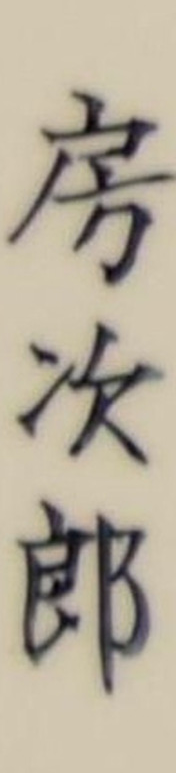房次郎

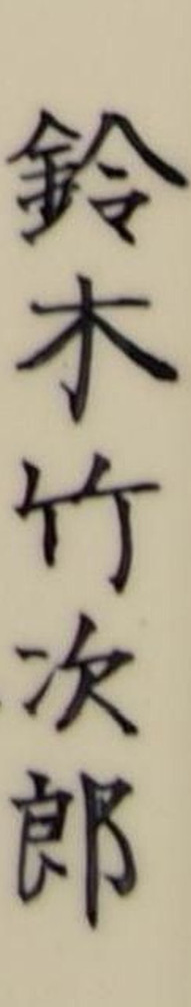鈴木竹次郎
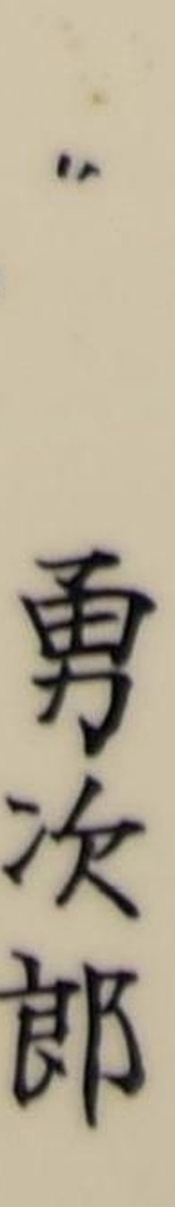勇次郎
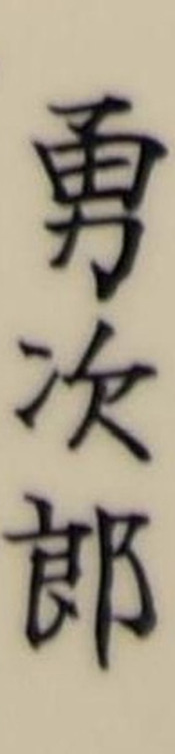勇次郎
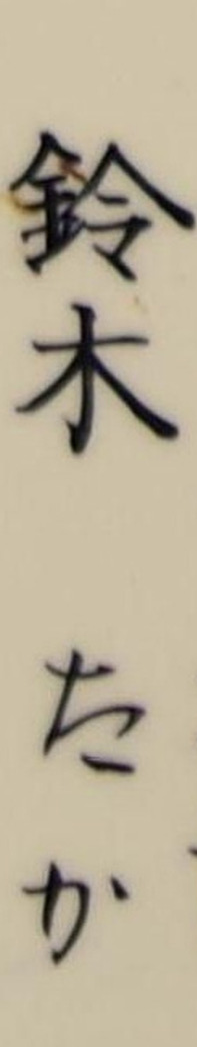鈴木たか
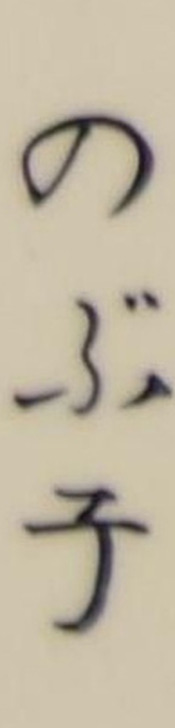のぶ子
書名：A~D
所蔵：koyasan kongobuji
